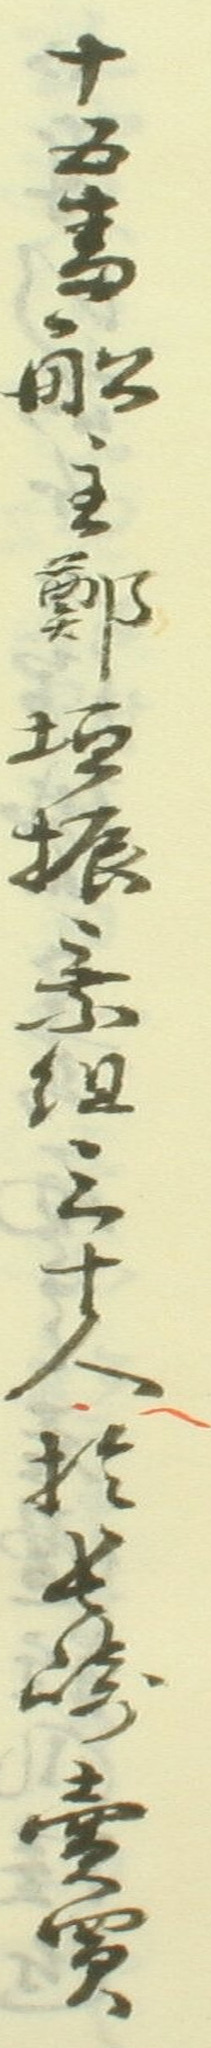十五番船主鄭垣振乗組三十人・於長崎売買
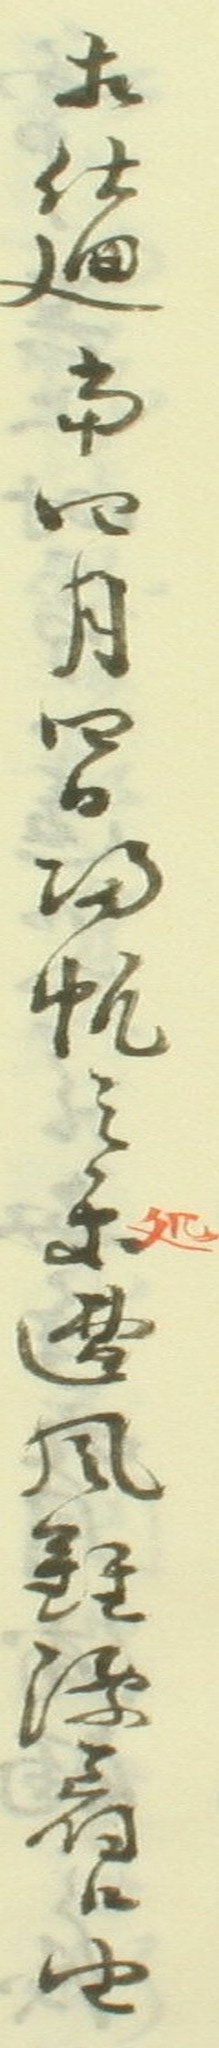相仕廻当四月四日帰帆之処遭風難漂着候由
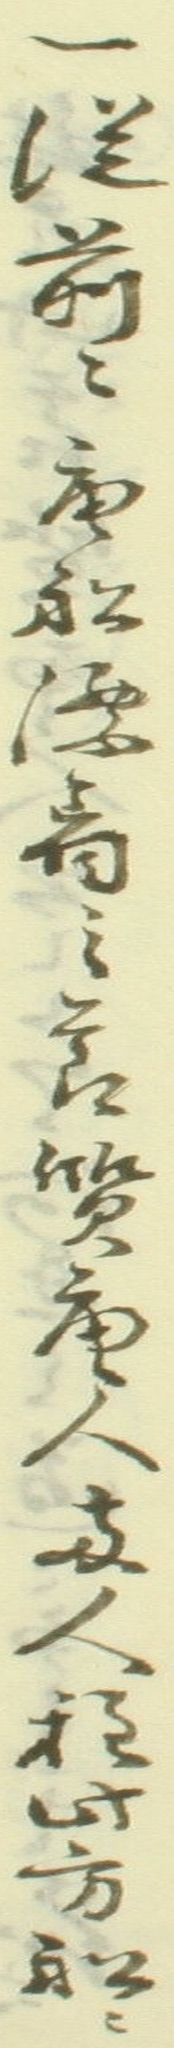一従前々唐船漂着之節質唐人両人程此方船に
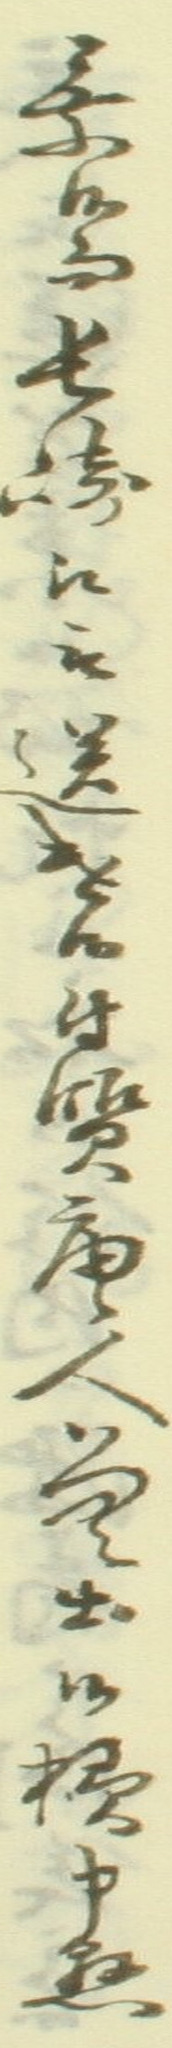乗候而長崎え被送遣候付質唐人差出候様申懸
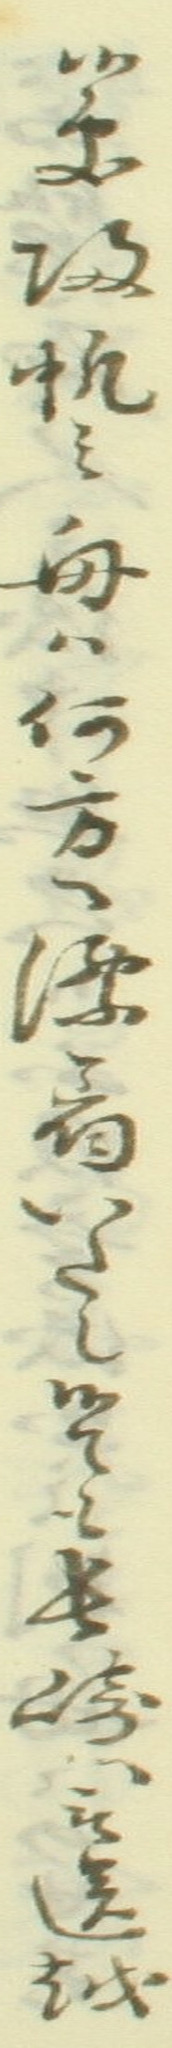候処帰帆之舟は何方へ漂着いたし候ても長崎へ被送越
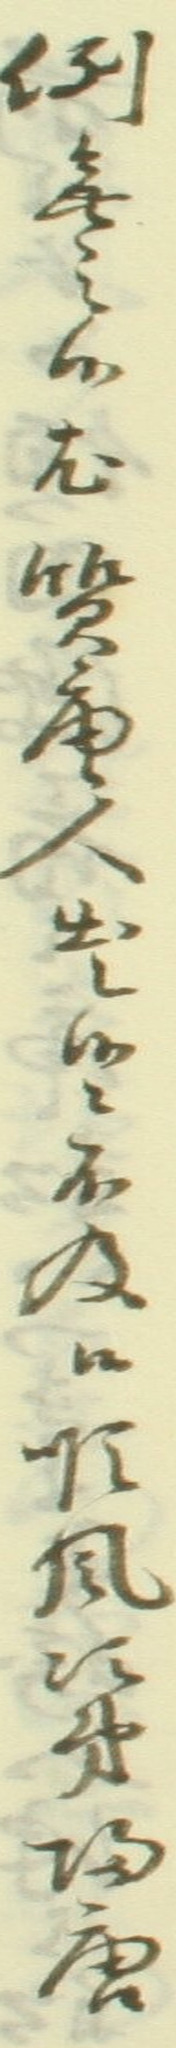例無之候尤質唐人出し候に不及候順風次第帰唐
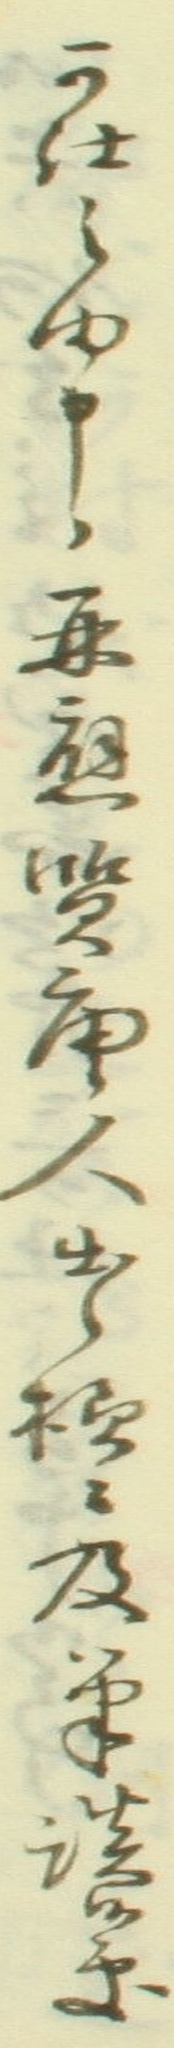可仕之由申候再応質唐人出候様に及筆談候処
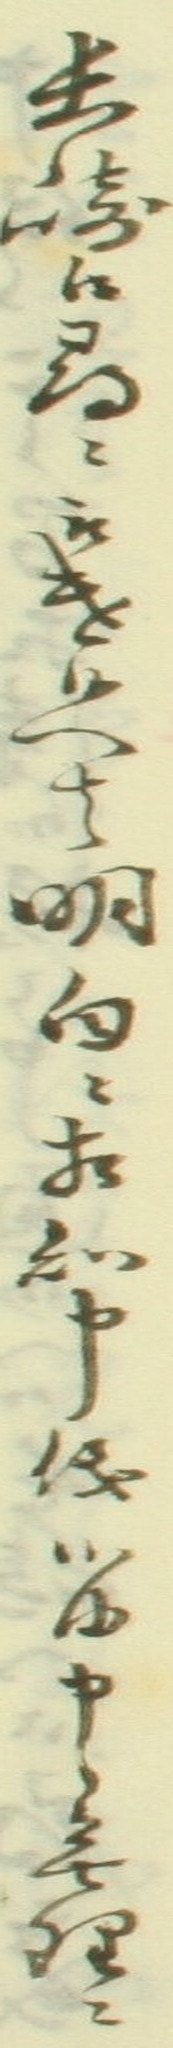長崎え尋に被遣候へは明白に相知申儀候由申し無理に
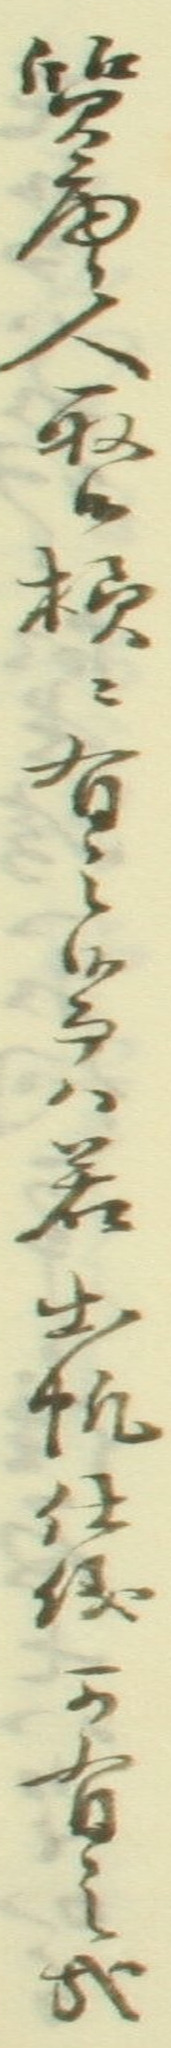質唐人取候様に有之候而は若出帆仕儀可有之哉

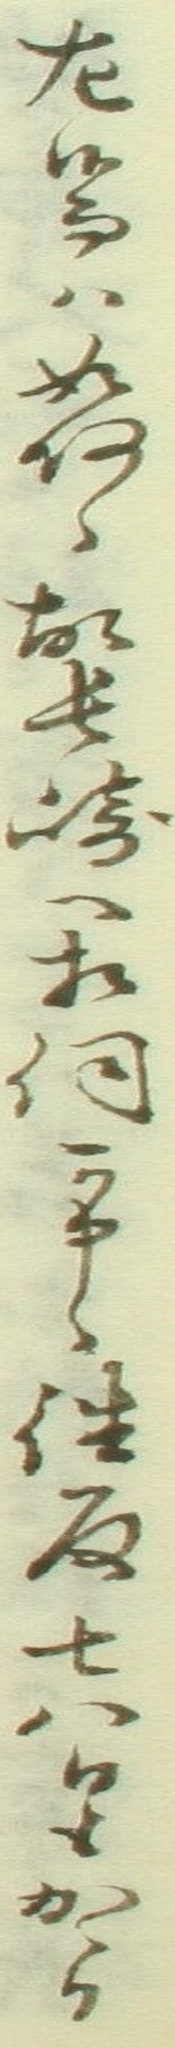左候而は如何候故長崎へ相伺可申候往反七八日もかゝり
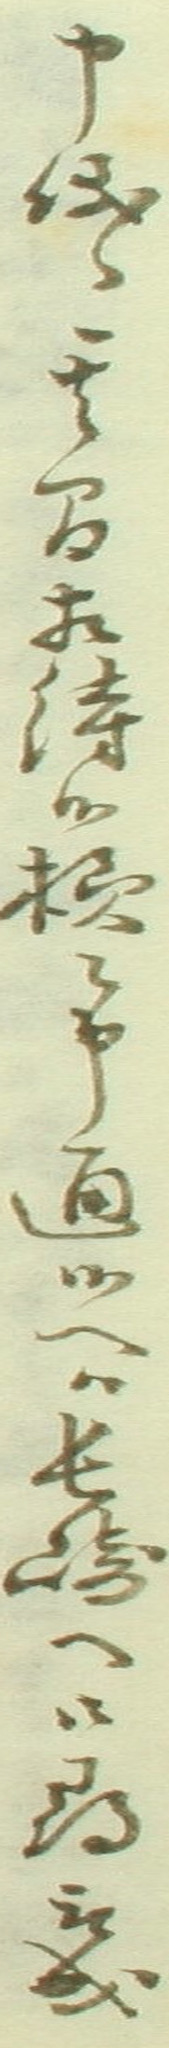申儀候其間相待候様に申通候へは長崎へは尋被成
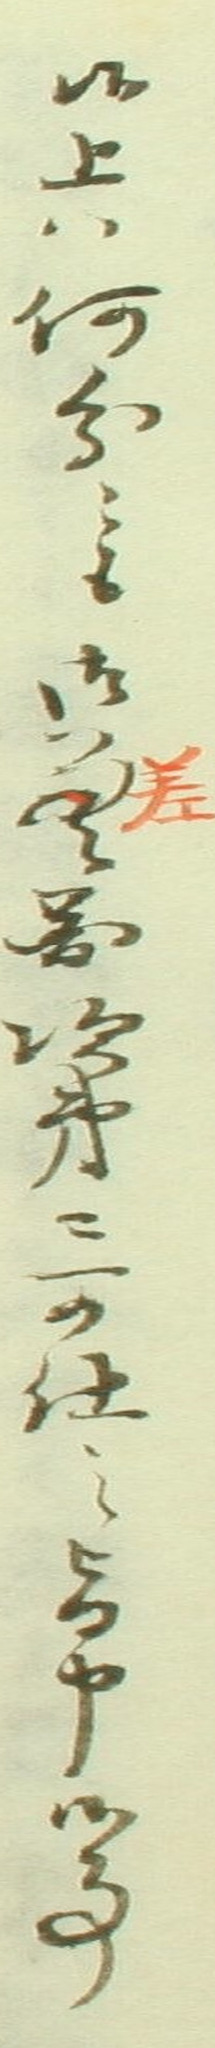候上は何分にも御差図次第に可仕之旨申候事
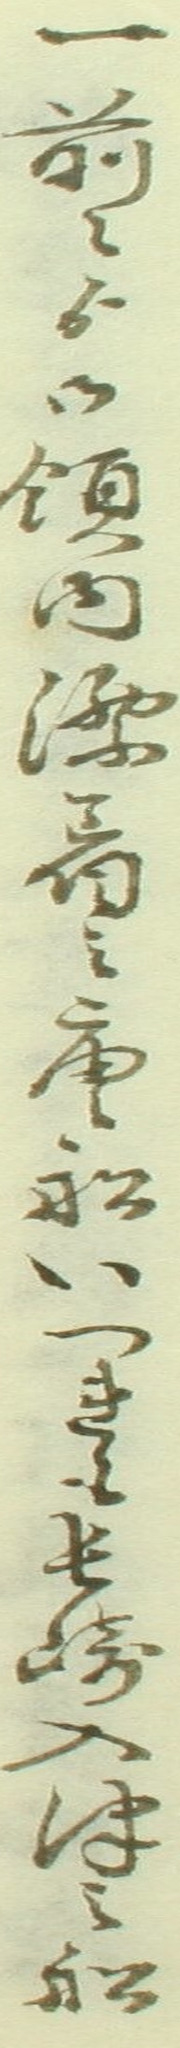一前々ゟ御領内漂着之唐船いつれも長崎入津之船
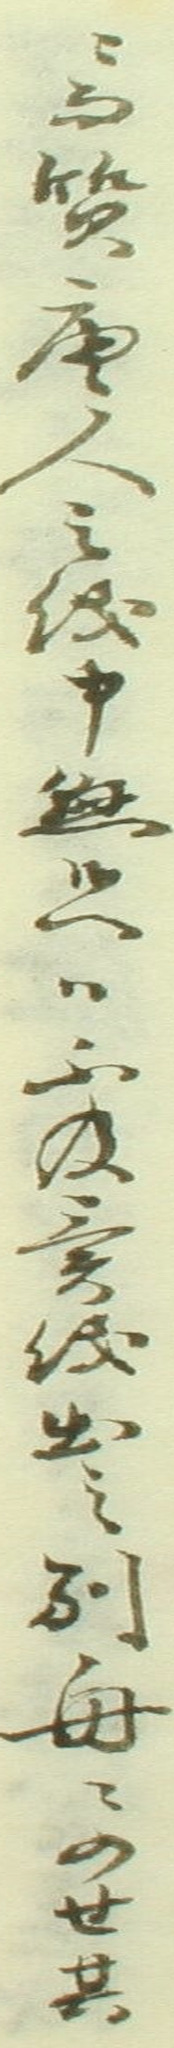に而質唐人之儀申懸候へは不及異儀出之別舟にのせ其
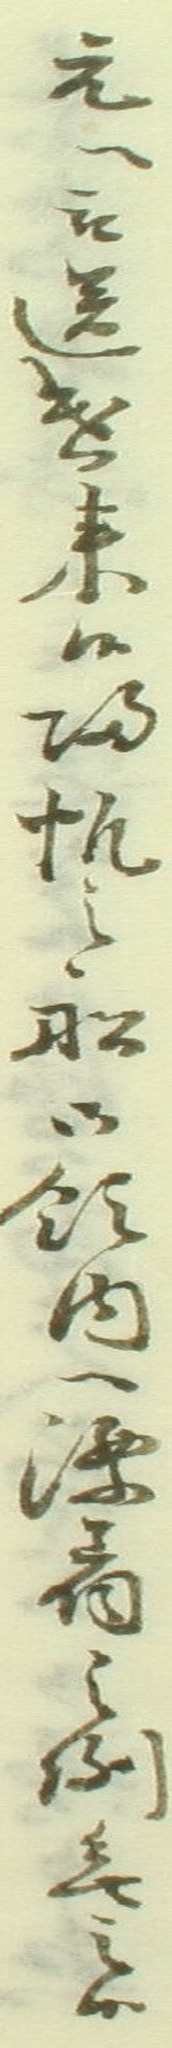元へ被送遣来候帰帆之船御領内へ漂着之例無之候
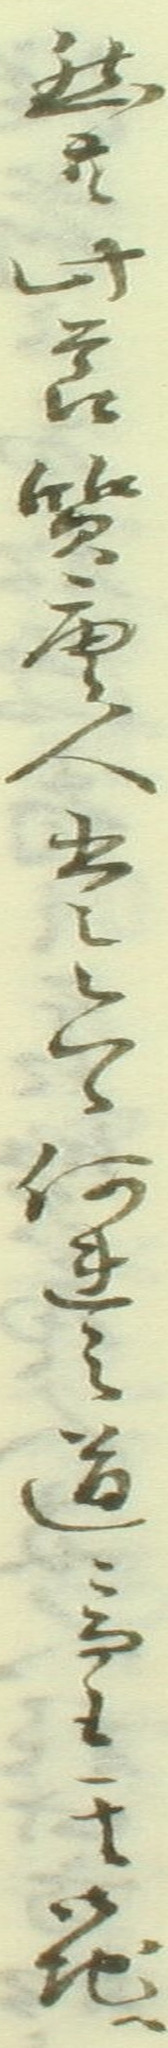然共此節質唐人出し候はゝ何れ之道に而も其御地へ
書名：異国船漂着記
